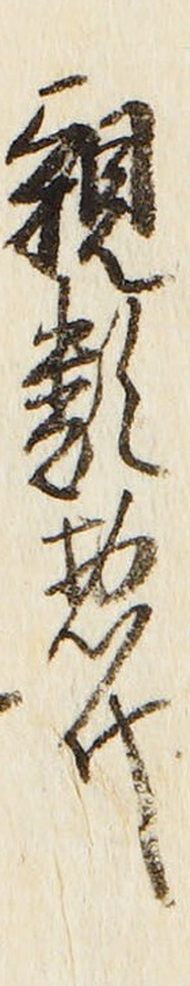親類惣代
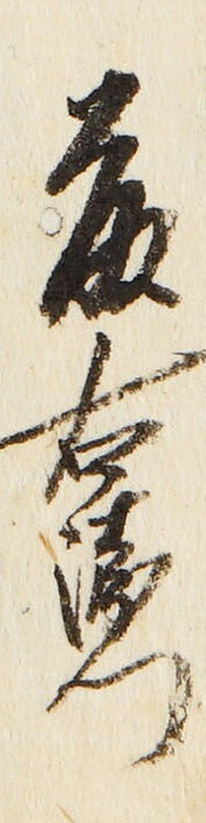藤右衛門
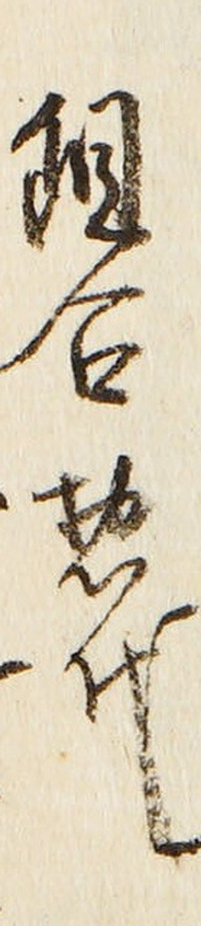組合惣代
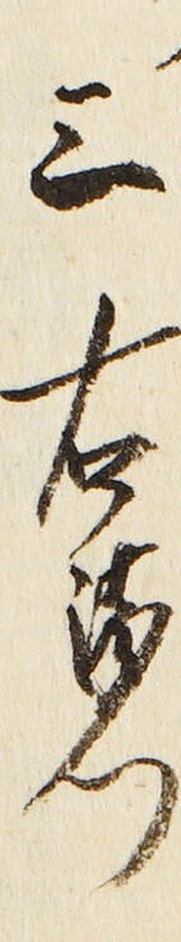三右衛門
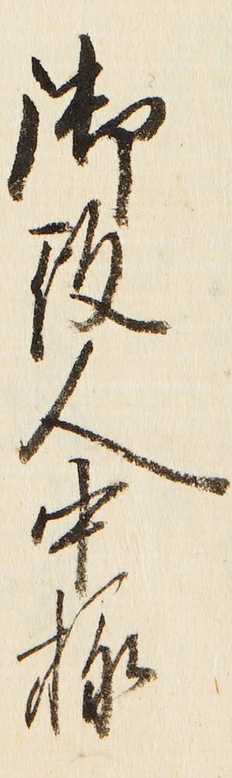御役人中様
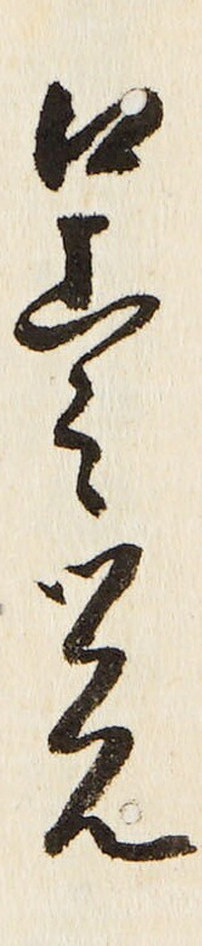口上之覚
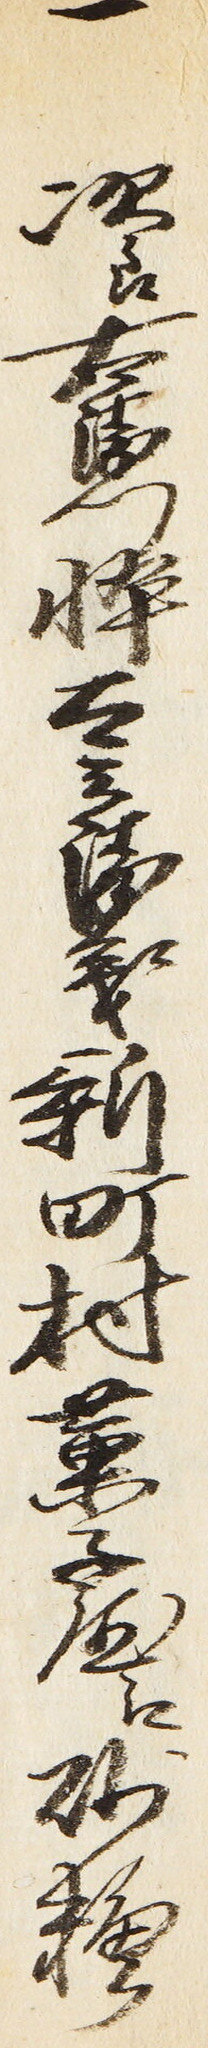一次郎右衛門忰太兵衛義新町村菓子屋江砂糖
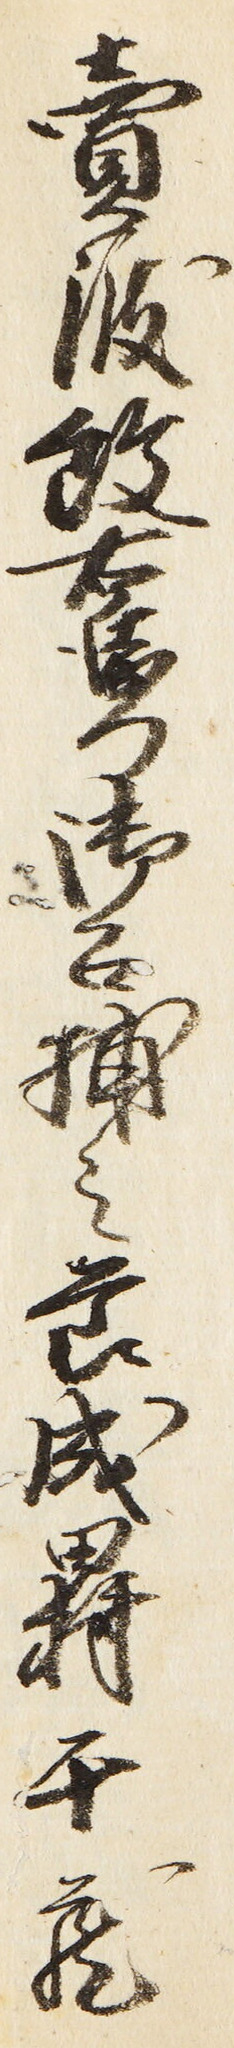売渡政右衛門御召捕之節成田村千蔵
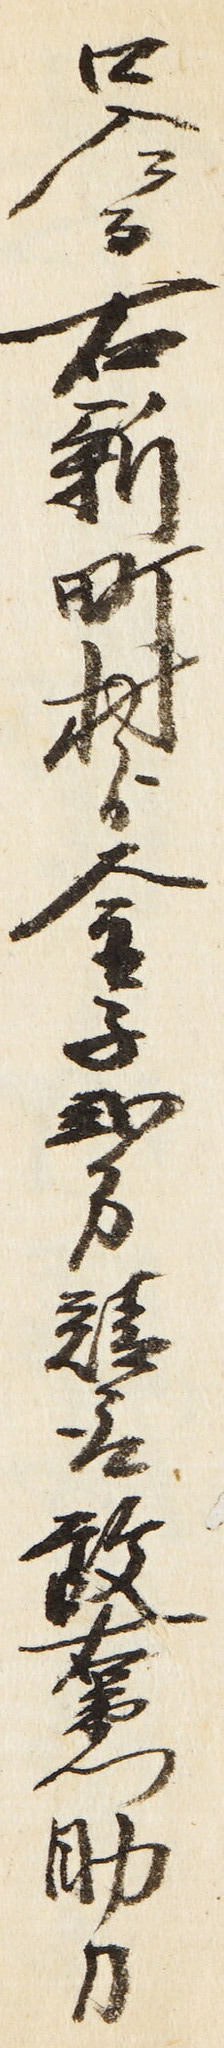口入ニ而右新町村ゟ金子弐分請取政右衛門助力
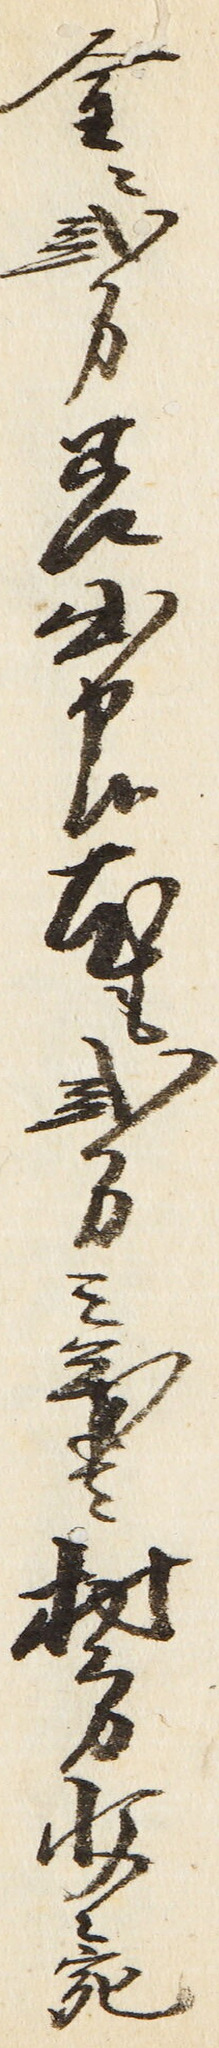金ニ弐分差出申候尤も弐分之義者村方少々宛
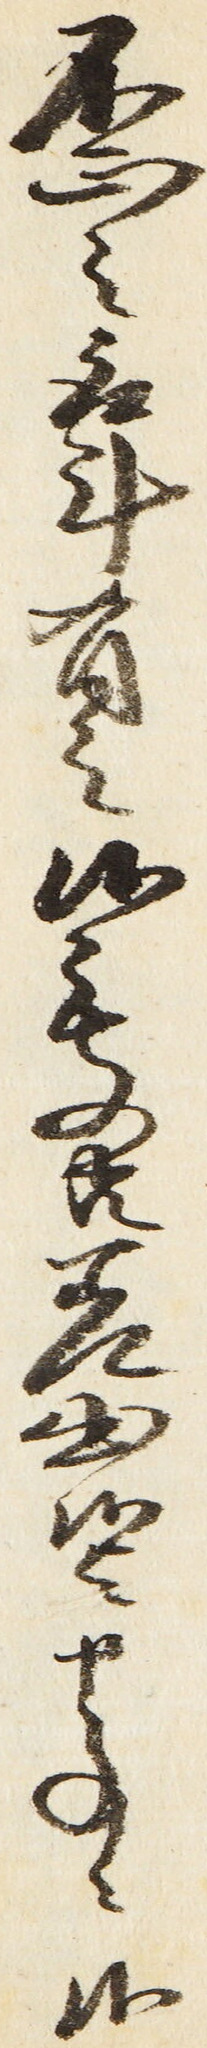不正之取計有之候もの共差出候与申事ニ候
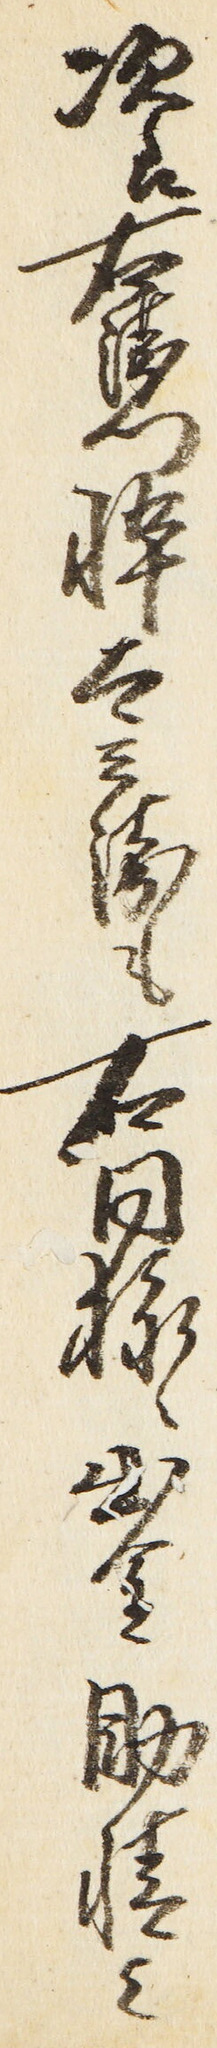次郎右衛門忰太兵衛も右同様ニ出金助情与

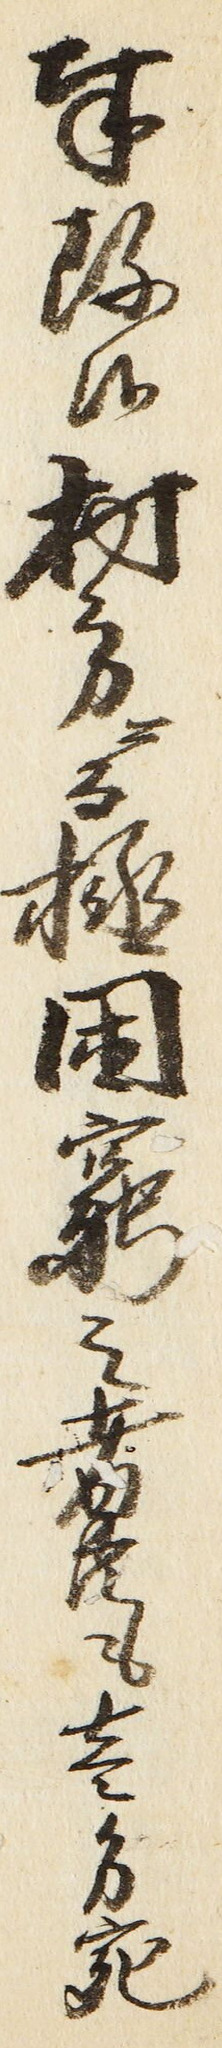奉存候村方ニ而極困窮之者共も壱分宛
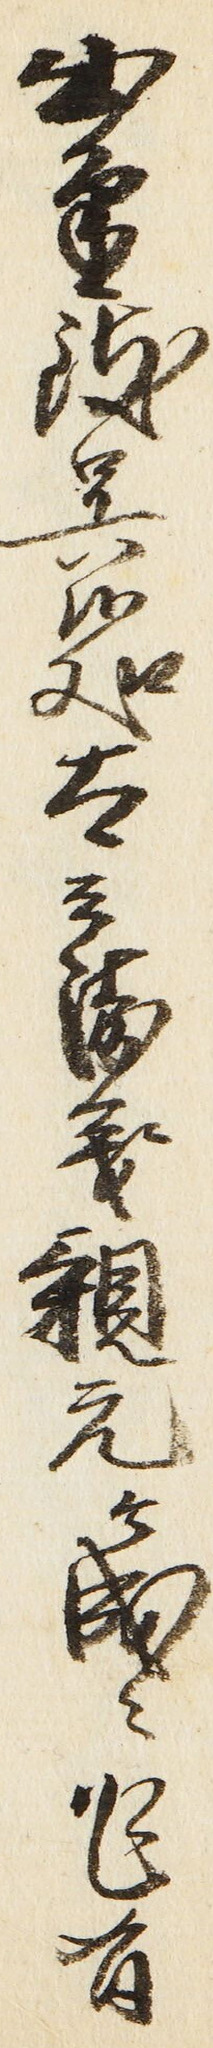出金致呉候処太兵衛義親元ケ成ニ乍有
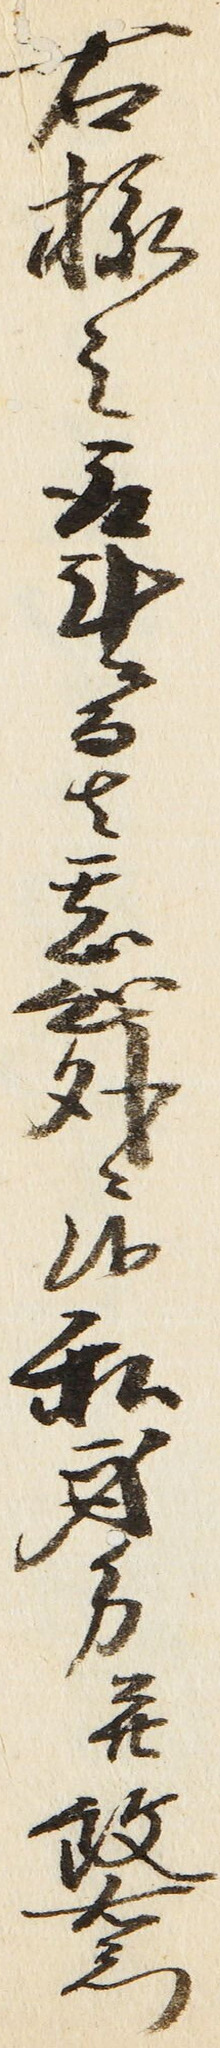右様之取計ニ而者甚心外ニ候私身方并政右衛門
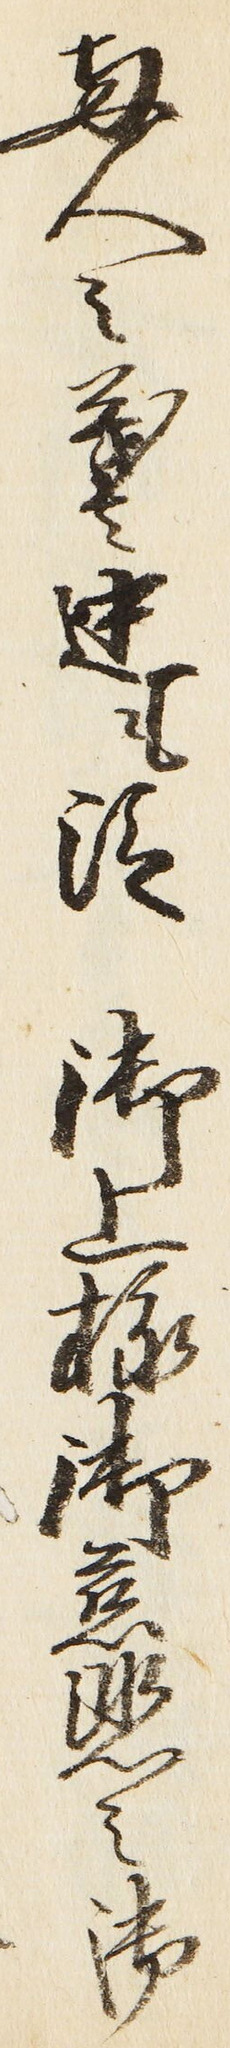両人之義者迚も従御上様御慈悲之御
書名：難船一件記録
